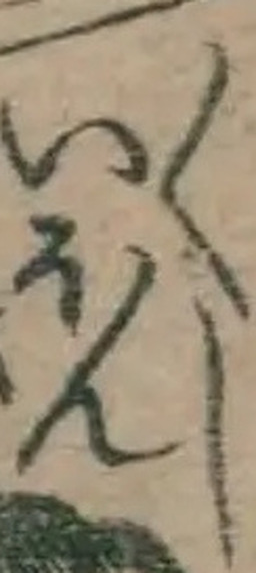いほん
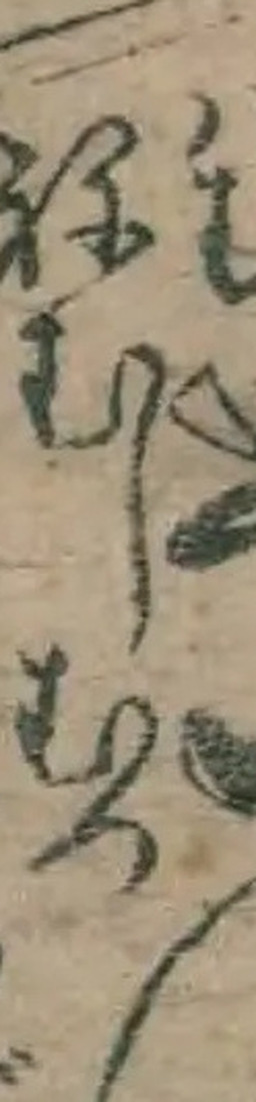ねむしむつ
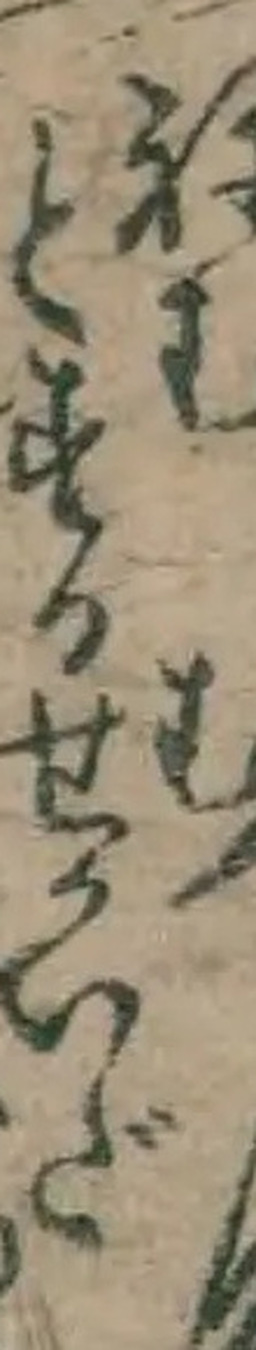とするせかいだ
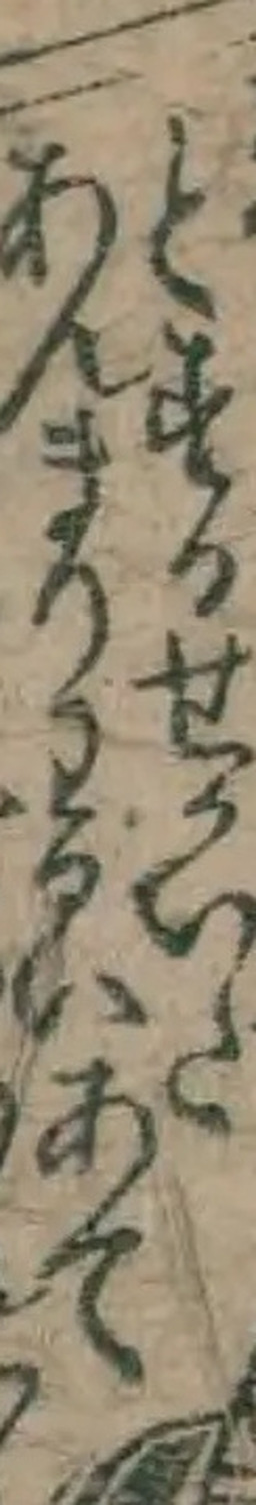あんまりわるいあて
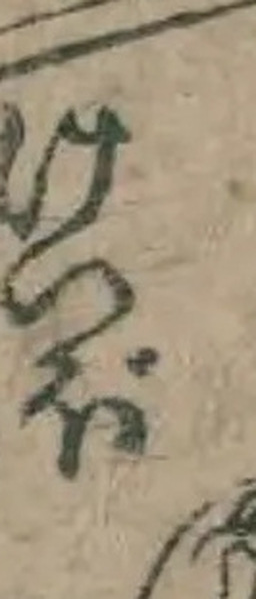けいぼ
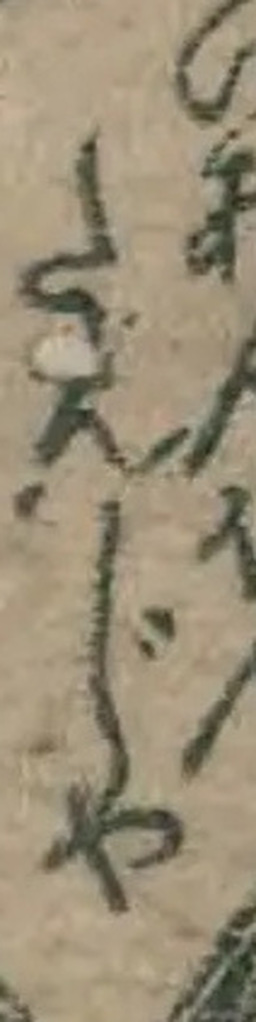たんじや
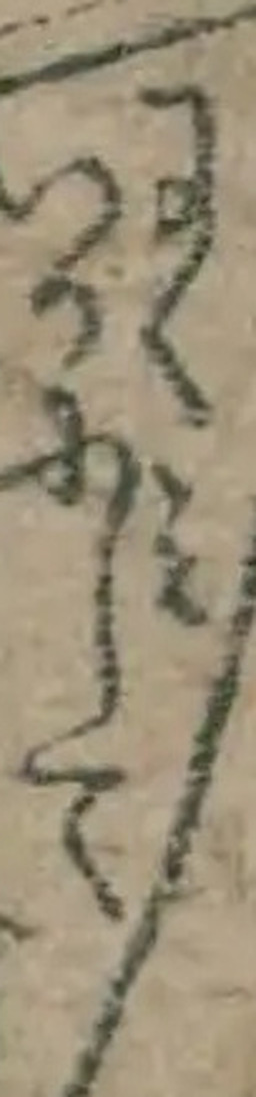いかにして
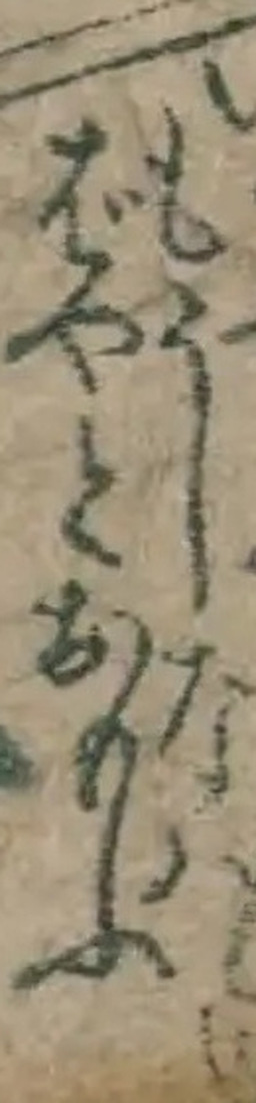ばやとおもふ

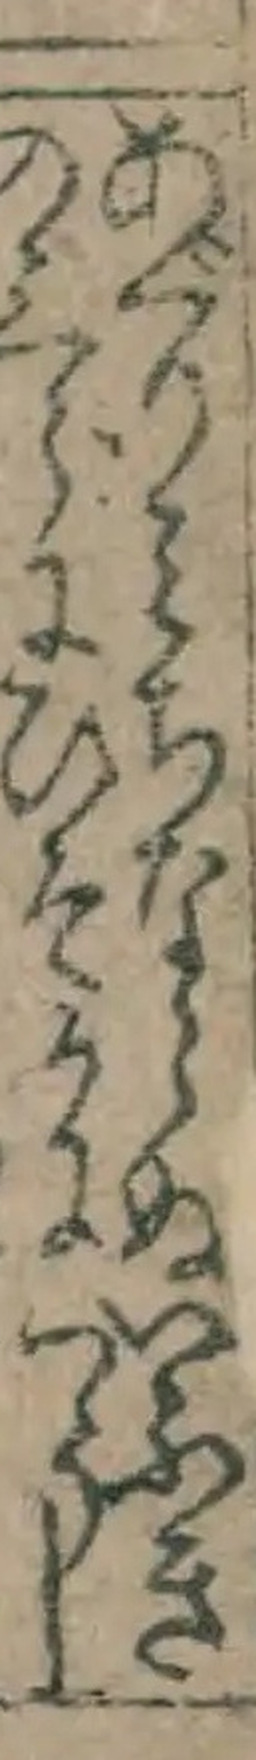の三郎にひそかにつうし
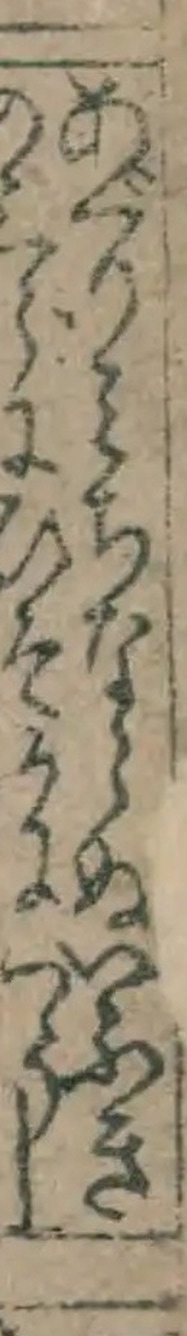あぐりみちならぬいふき
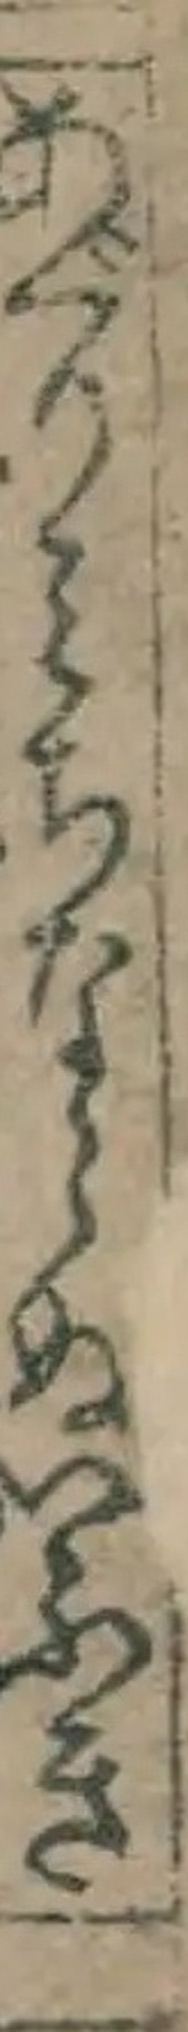あぐりみちならぬいふき
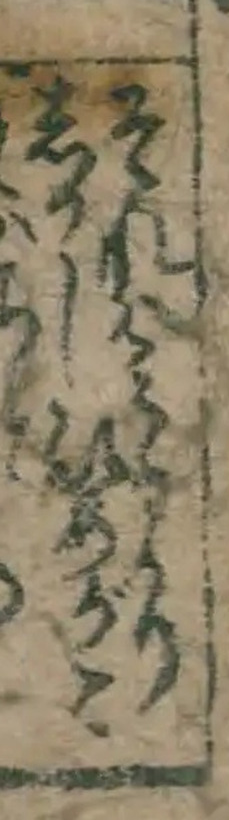しかしひめがこ
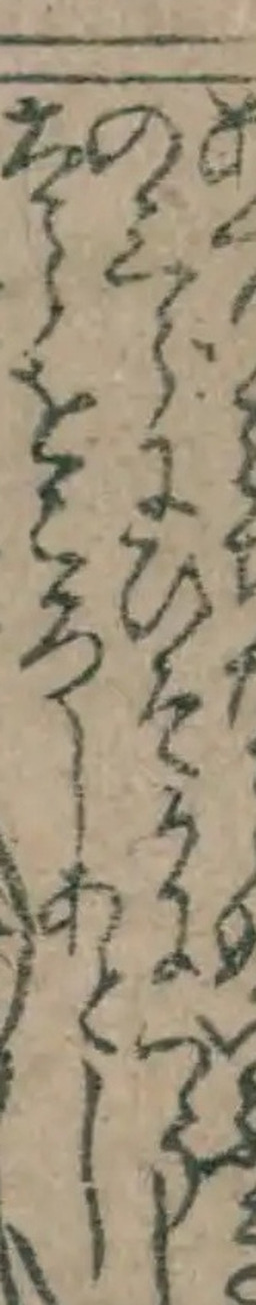太らうをころしあとし
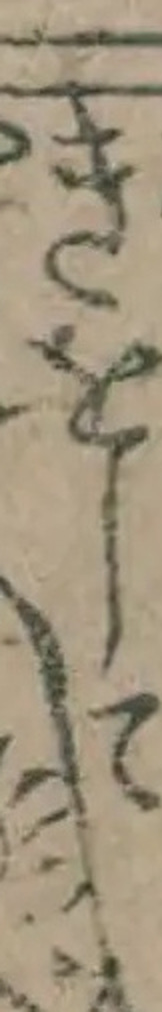きをして
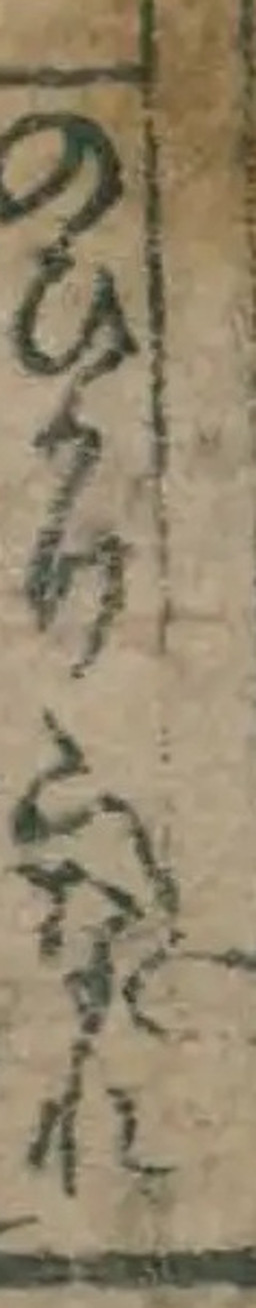のひかけ山なれ
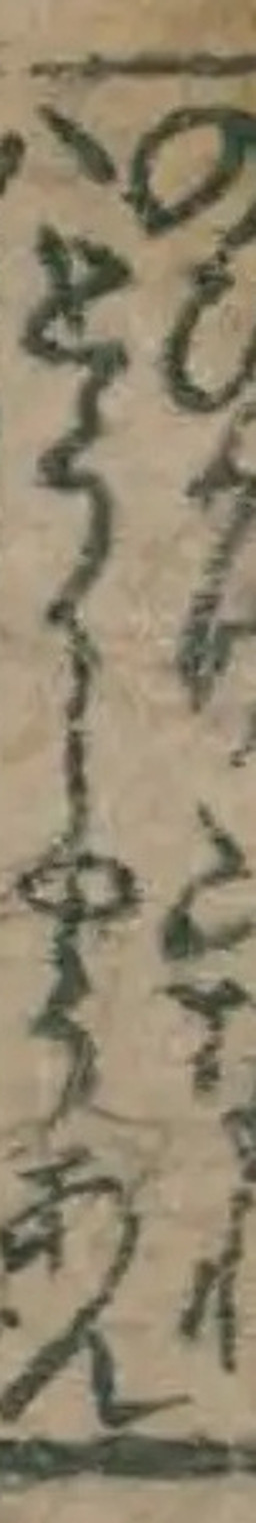はとうしやうあん
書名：団十郎蓬芥伝
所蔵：国立国会図書館 National Diet Library, JAPAN
